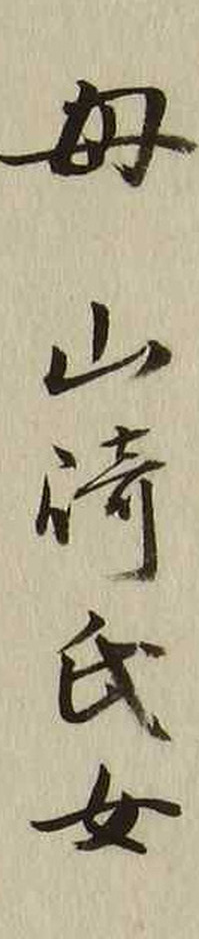母山崎氏女
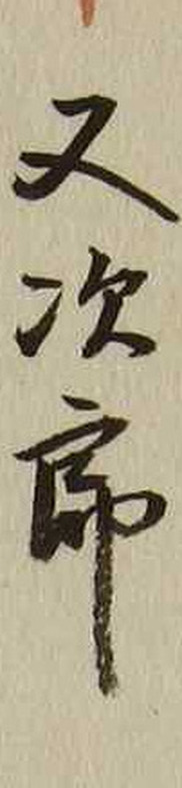又次郎
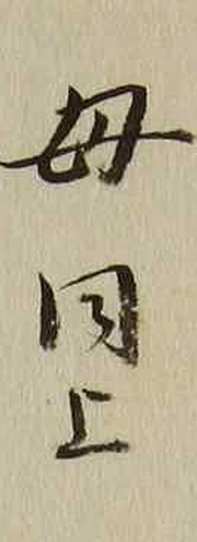母同上
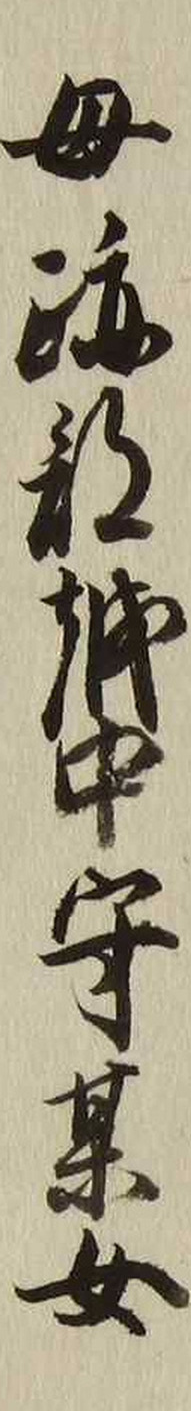母跡部越中守某女
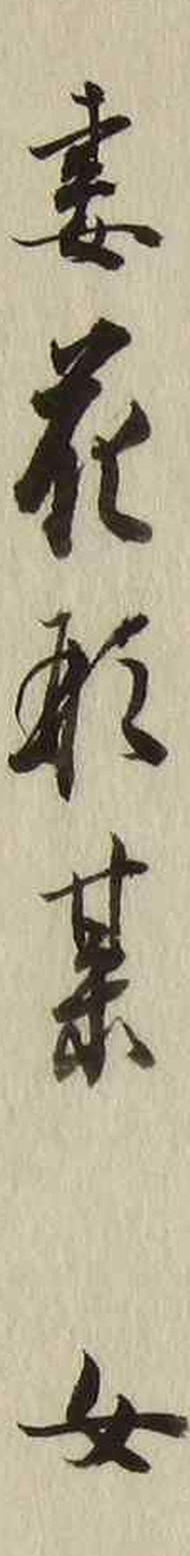妻花形某女
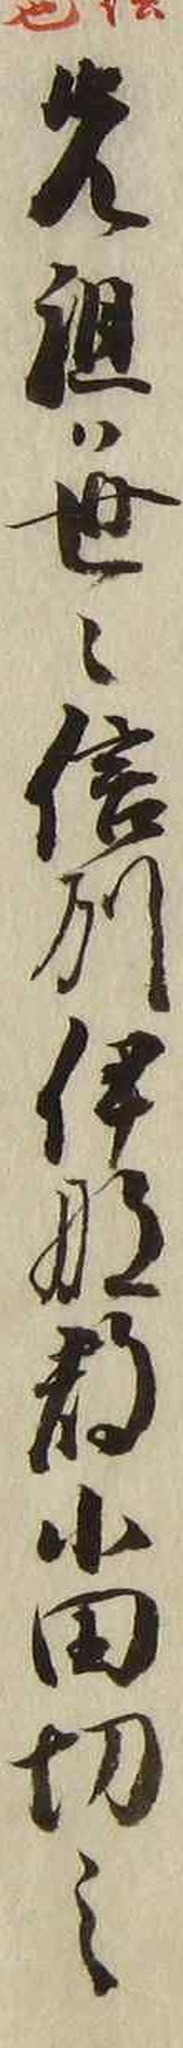先祖ハ世々信州伊奈郡小田切之
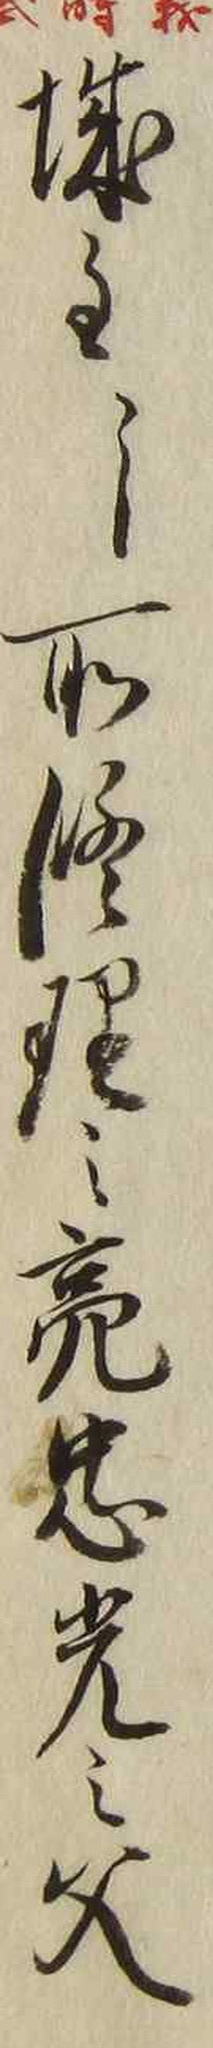城主之所修理之亮忠光之父

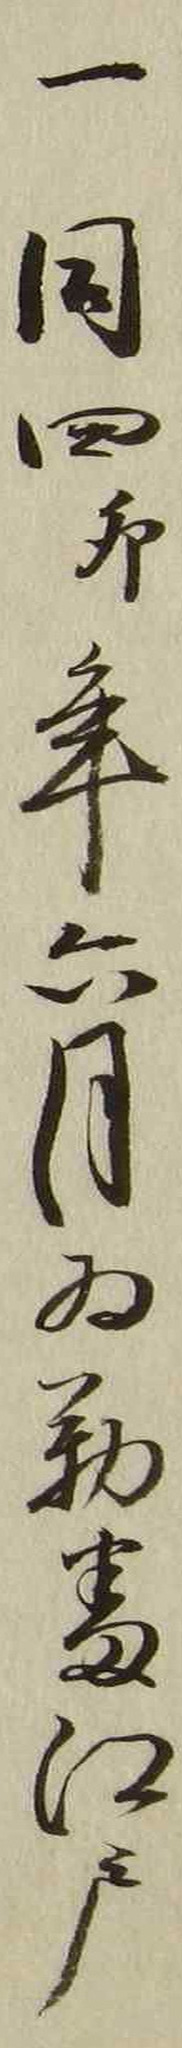一同四卯年六月為勤番江戸
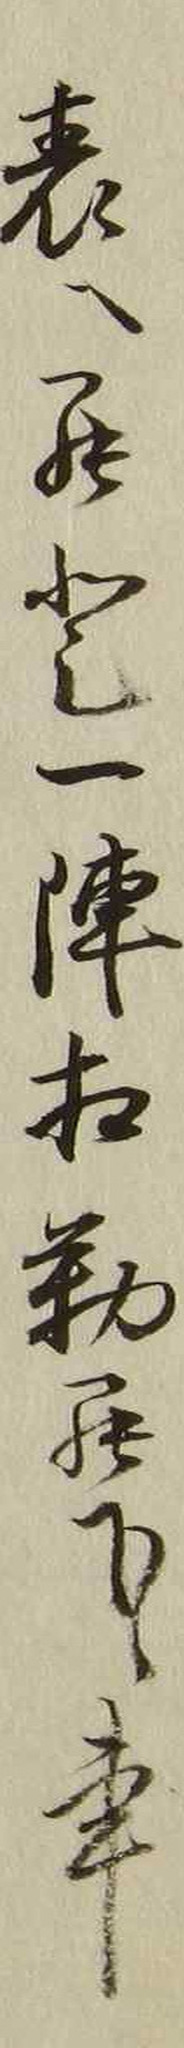表へ罷登一陣相勤罷下候事
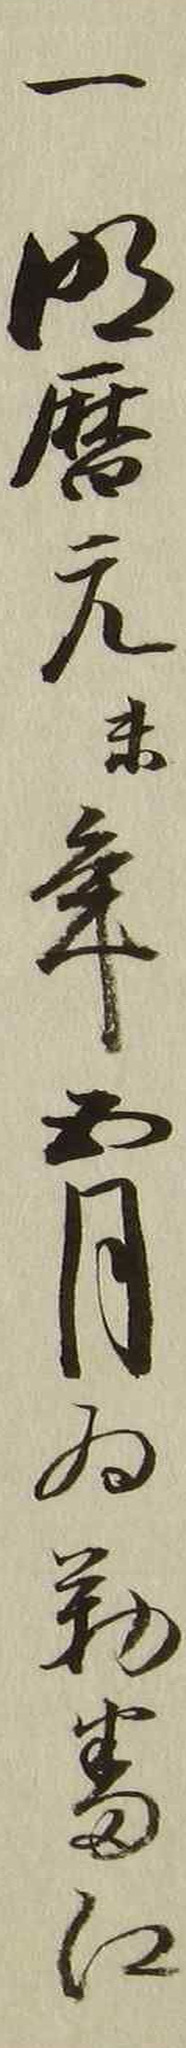一明暦元未年五月為勤番江
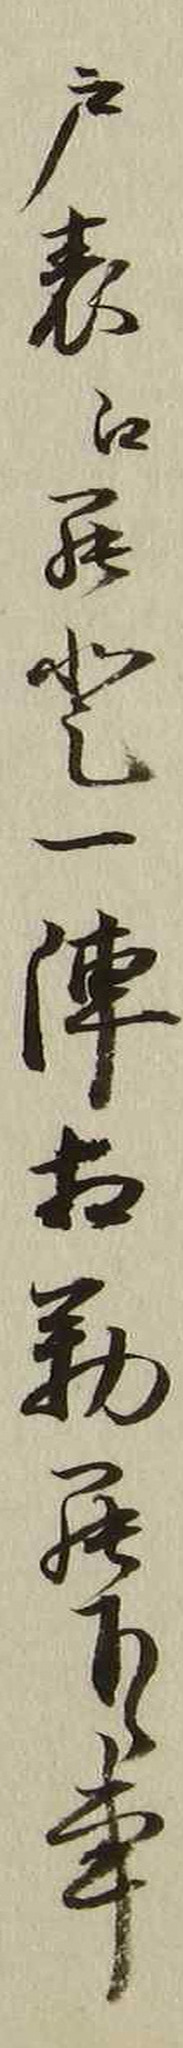戸表江罷登一陣相勤罷下候事
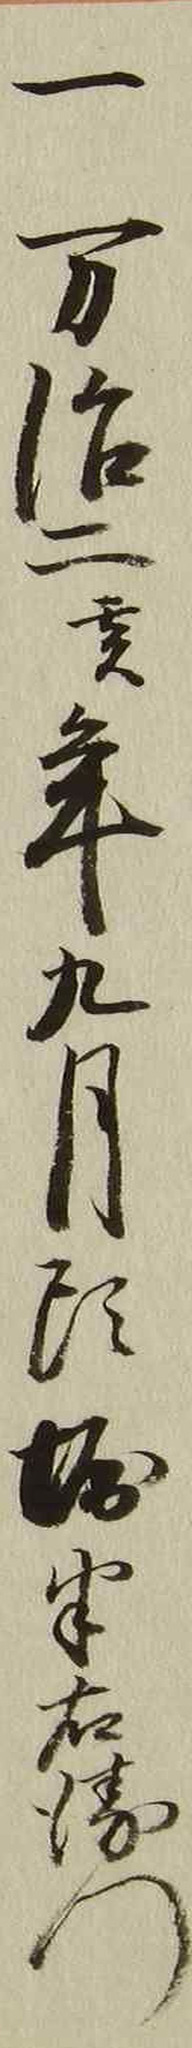一万治二亥年九月頭堀半右衛門
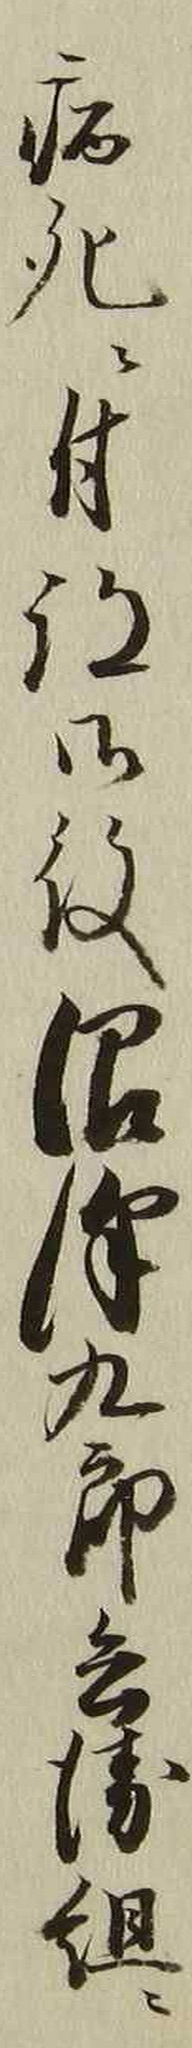病死ニ付跡御役沼沢九郎兵衛組ニ
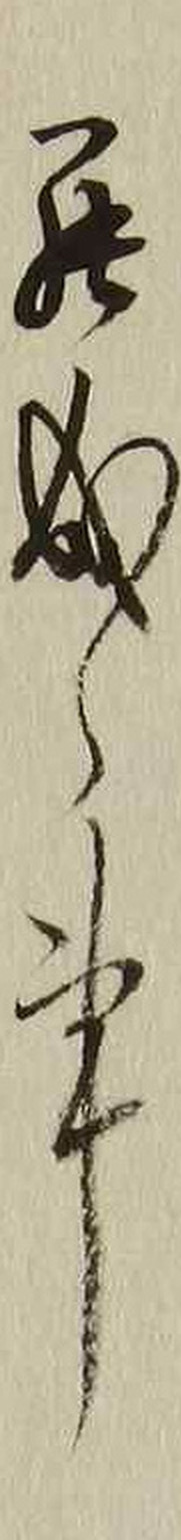罷成候事
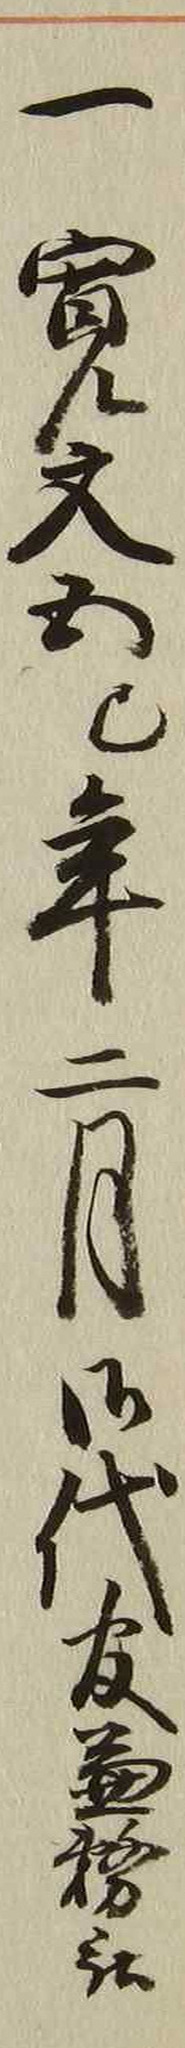一寛文五巳年二月御代官兼務被
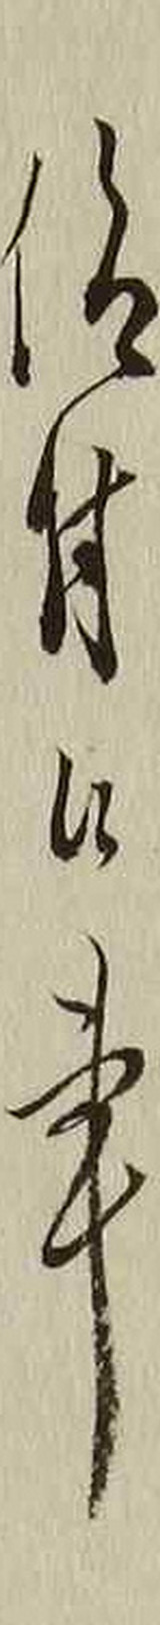仰付候事
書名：諸士系譜　巻之69　を之部3
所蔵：会津若松市立会津図書館
